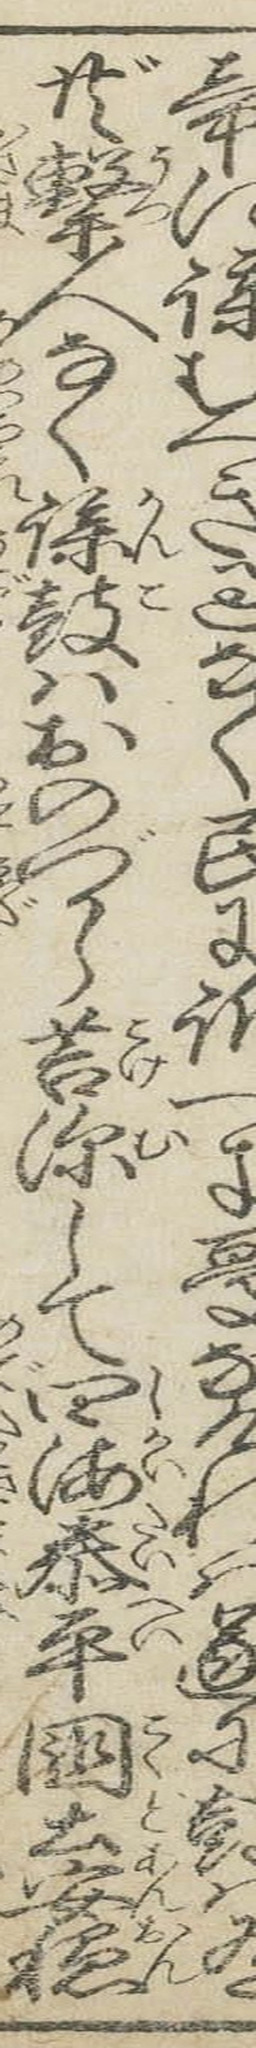〝共撃人なく諫鼓はおのづから苔深して四海泰平国土安穏
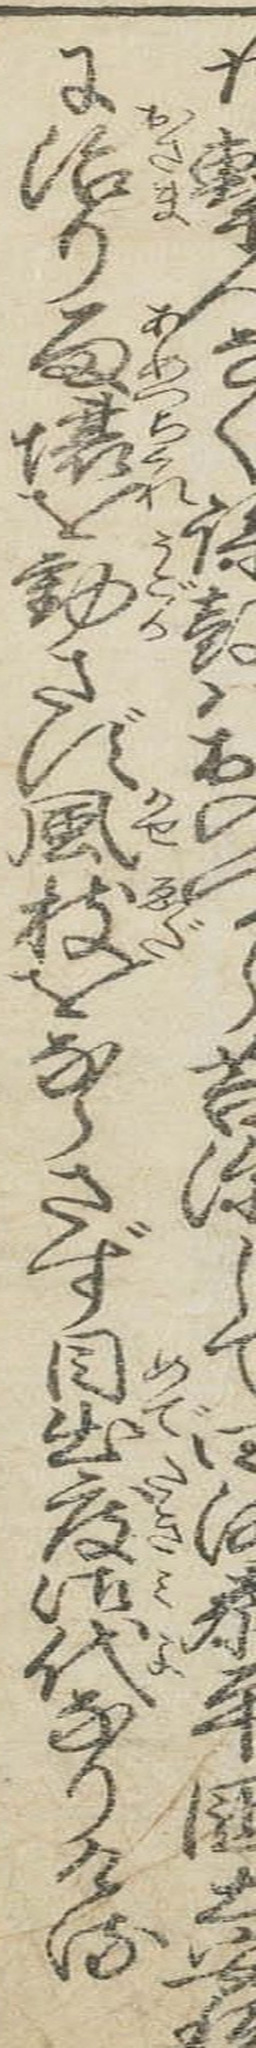に治り雨壌を動さず風枝をならさず目出度御代なりける
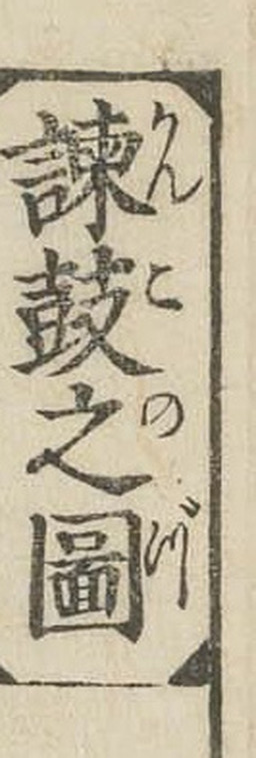諫鼓之図
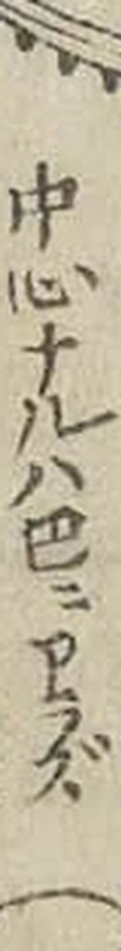中心ナルハ巴ニアラズ
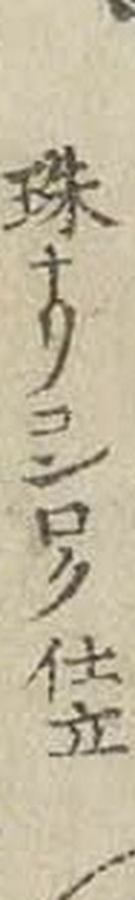珠ナリコンロク仕立
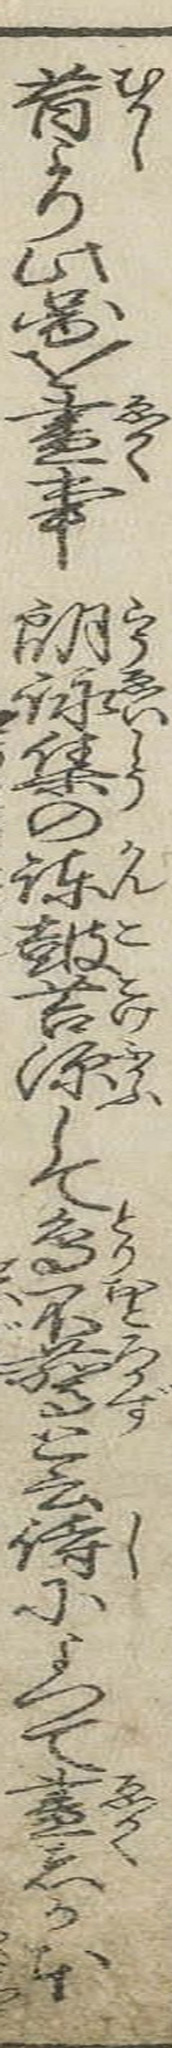昔より此図を画事朗詠集の諫鼓苔深して鳥不驚と云詩によつて画者か本
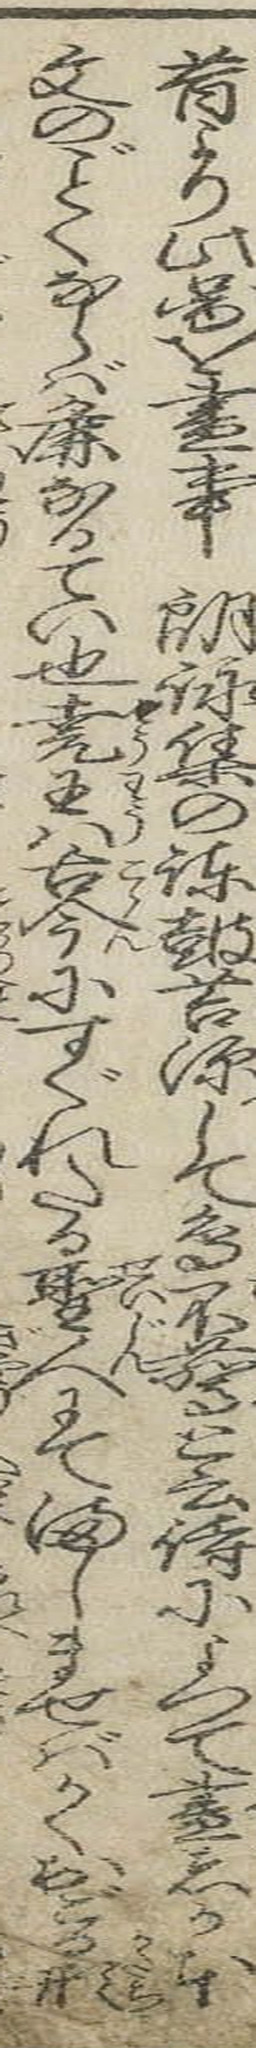文のごとくならば麤なるてい也尭王は古今にすぐれたる聖人にてましませばかくおごる形
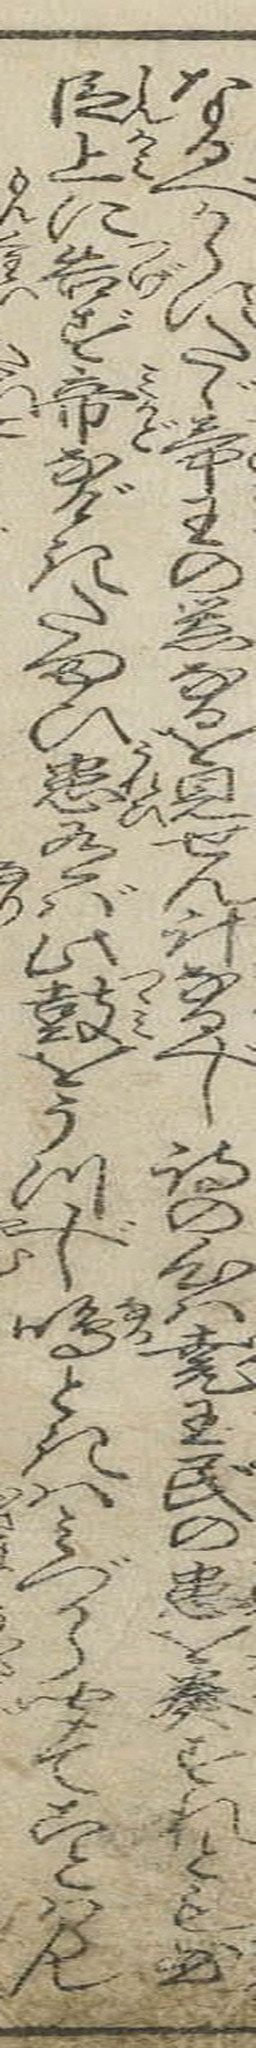臣上に告ず帝なげきたまひ患有ば此鼓をうつべし鳴ときはみづから聞てことはらん
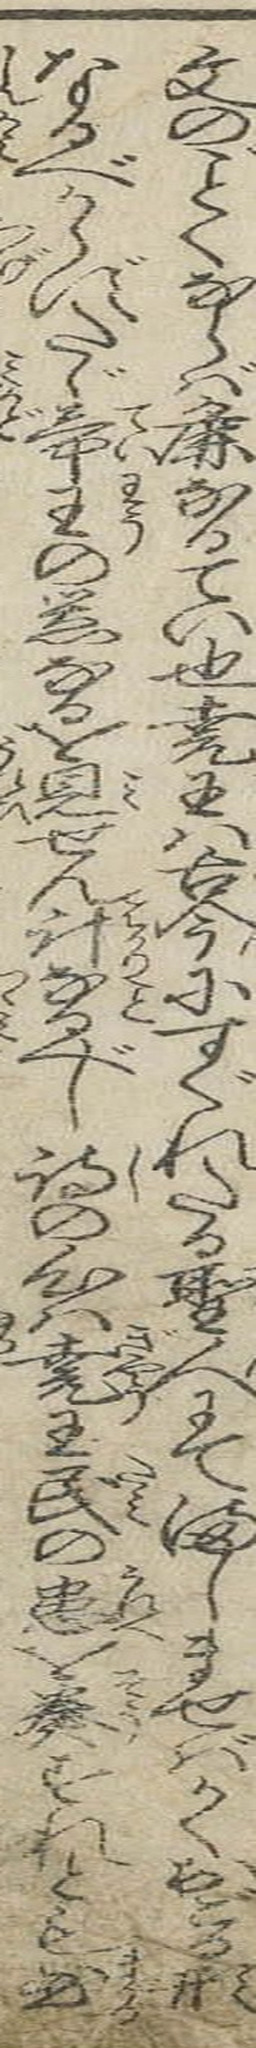なるべからずたゞ帝王の器なるを見せん計なるべし詩の心は尭王民の患を奏すれとも曲
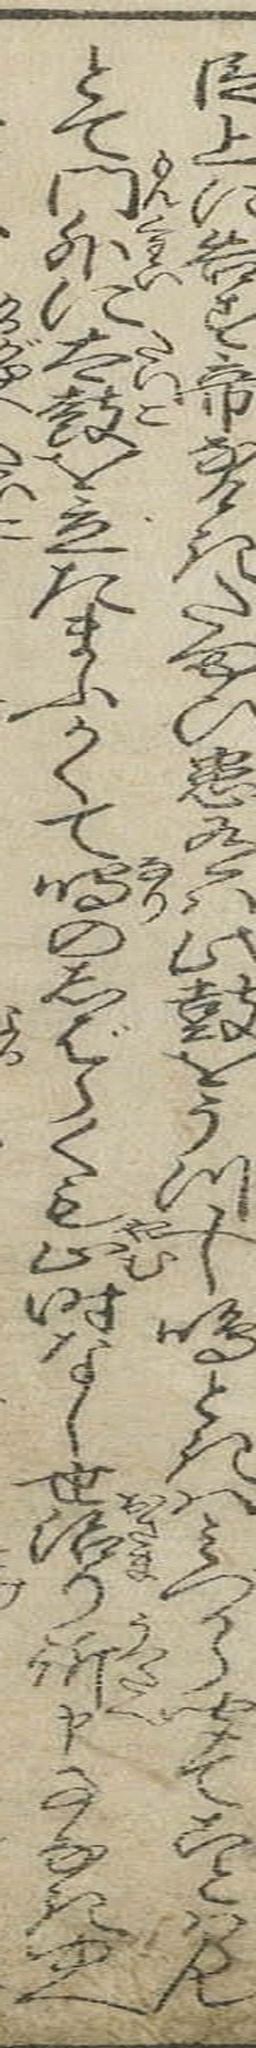とて門外に太鼓を立たまふかくて鳴のしばらくも止時なし世治り訴申事なきゆへ
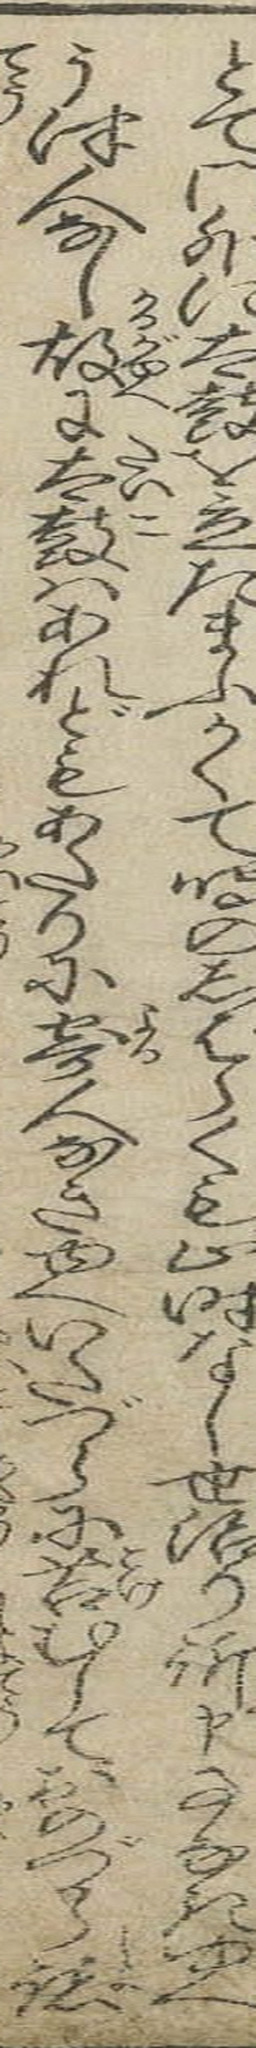うつ人なし故に太鼓はあれどもあたりに寄人なきゆへいたづらに苔むしておのづから諸
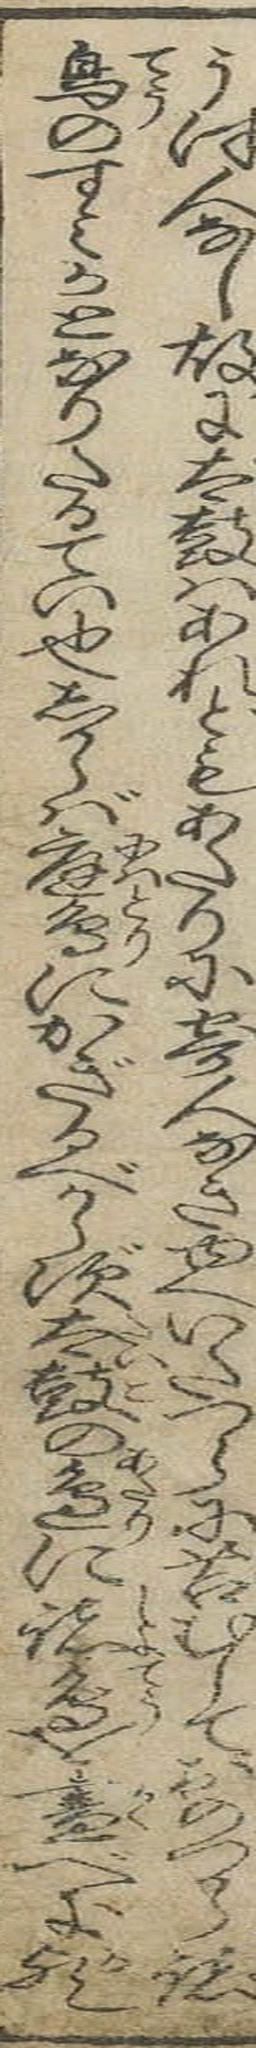鳥のすみかとなりたるてい也しからば庭鳥にかぎるべからず太鼓の辺に諸鳥を画べき歟

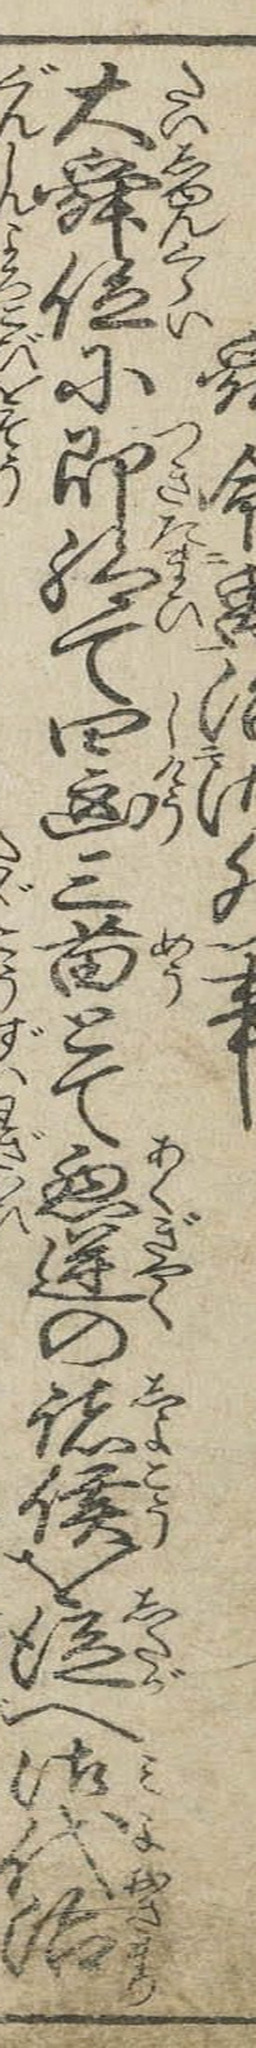大舜位に即給て四凶三苗とて悪逆の諸侯を従へ御代治
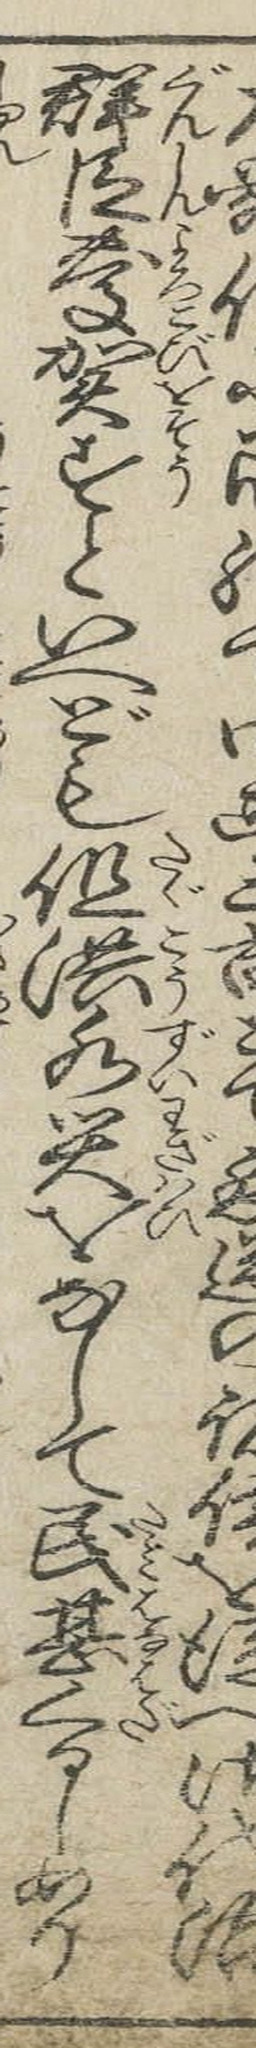群臣慶賀すといへども但洪水災をなして民甚くるしめり
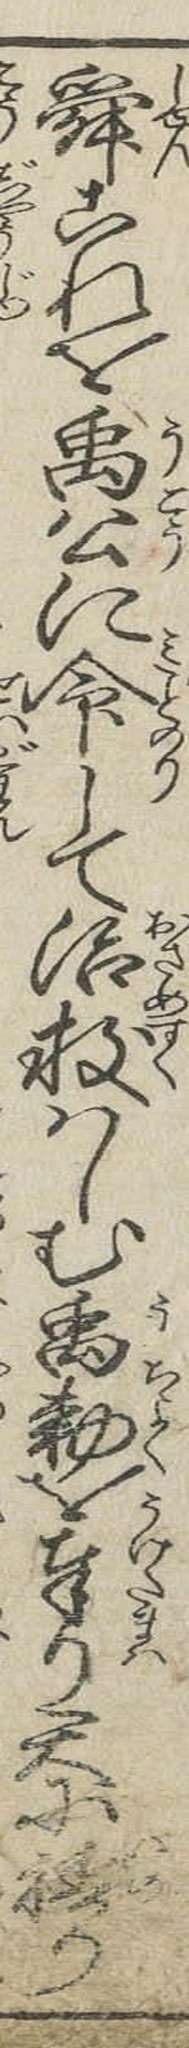舜これを禹公に命して治救はしむ禹勅を奉り天に祷り
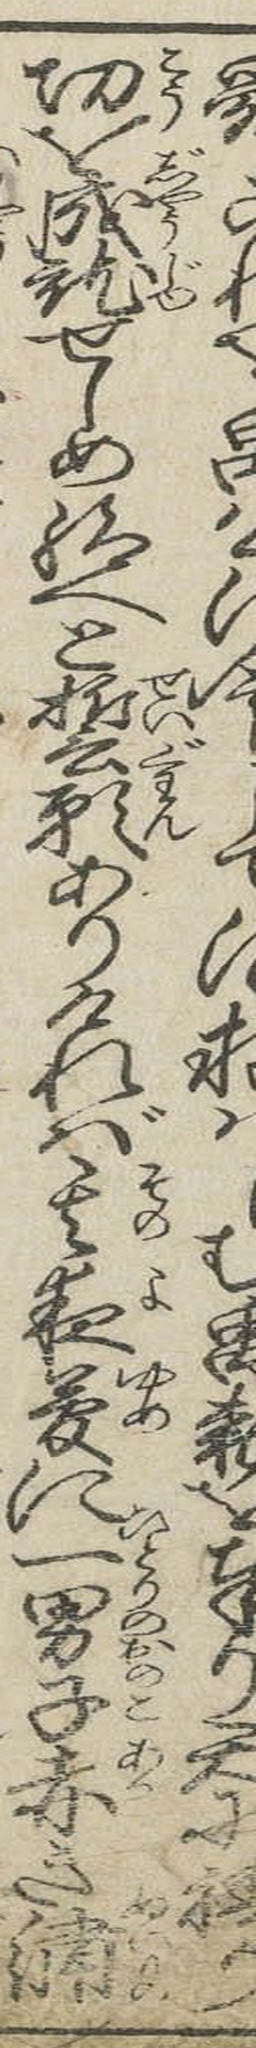功を成就せしめ給へと誓願ありければ其夜夢に一男子赤き繍
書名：絵本写宝袋 9巻 4之巻
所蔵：東京学芸大学教育コンテンツアーカイブ
